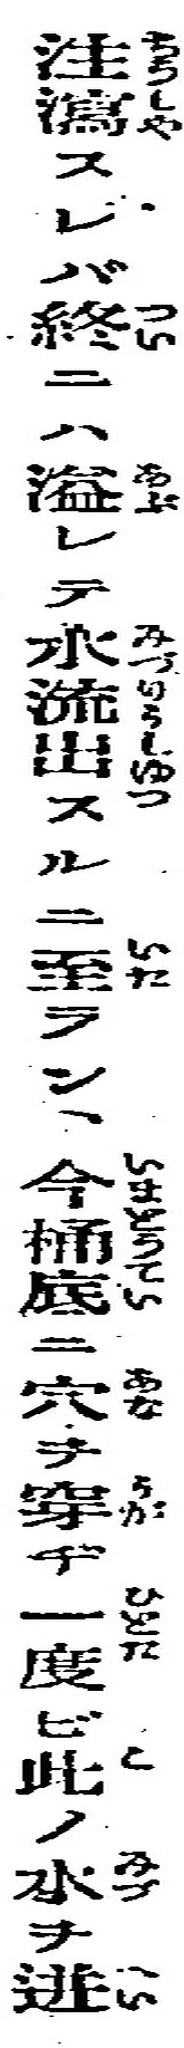注瀉スレバ終ニハ溢レテ水流出スルニ至ラン、今桶底ニ穴ヲ穿ヂ一度ビ此ノ水ヲ迸
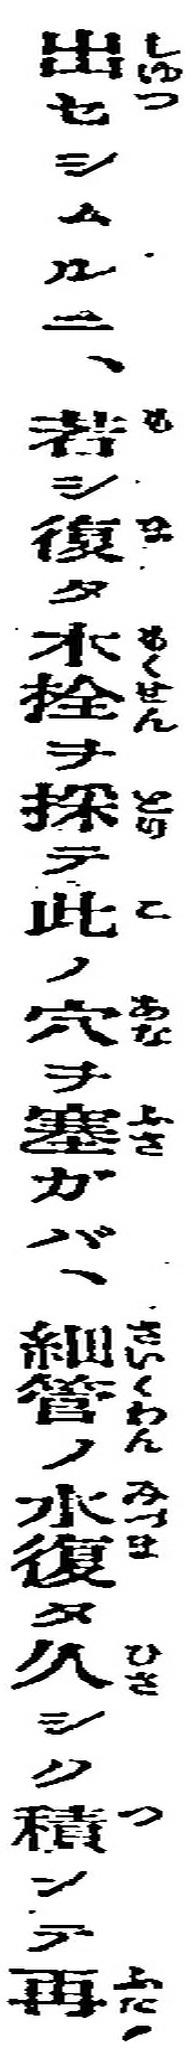出セシムルニ、若シ復タ木栓ヲ採テ此ノ穴ヲ塞ガバ、細管ノ水復タ久シク積ンデ再
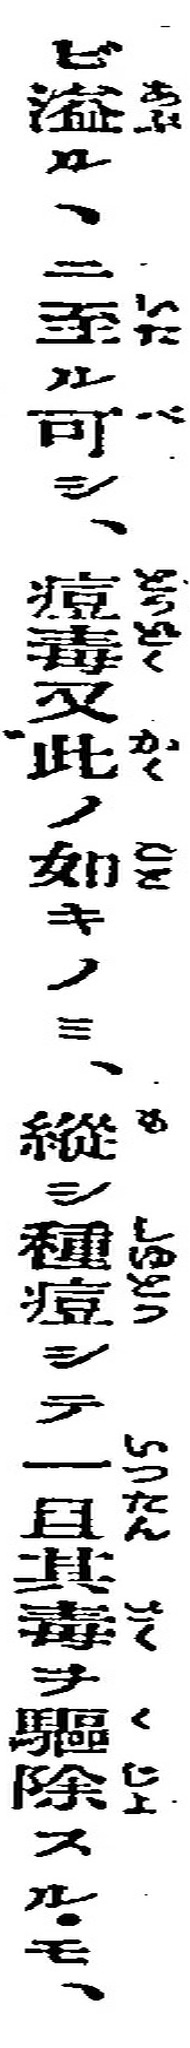ビ溢ルヽニ至ル可シ、痘毒又此ノ如キノミ、縱シ種痘シテ一旦其毒ヲ駆除スルモ、
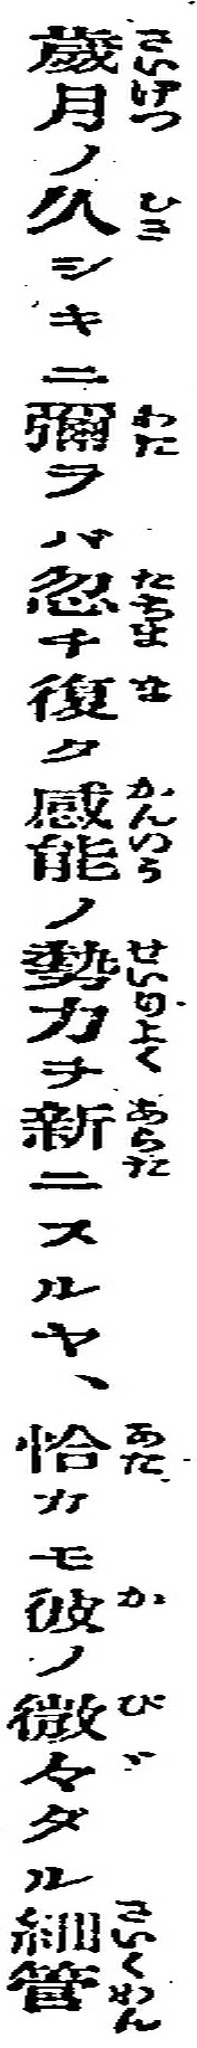歳月ノ久シキニ弥ラバ忽チ復タ感能ノ勢力ヲ新ニスルヤ、恰カモ彼ノ微々タル細管
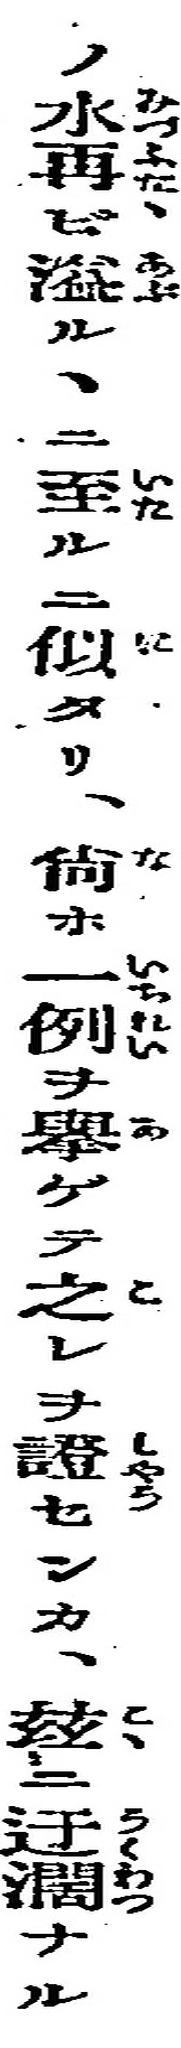ノ水再ビ溢ルヽニ至ルニ似タリ、尚ホ一例ヲ挙ゲテ之レヲ証センカ、茲ニ迂闊ナル
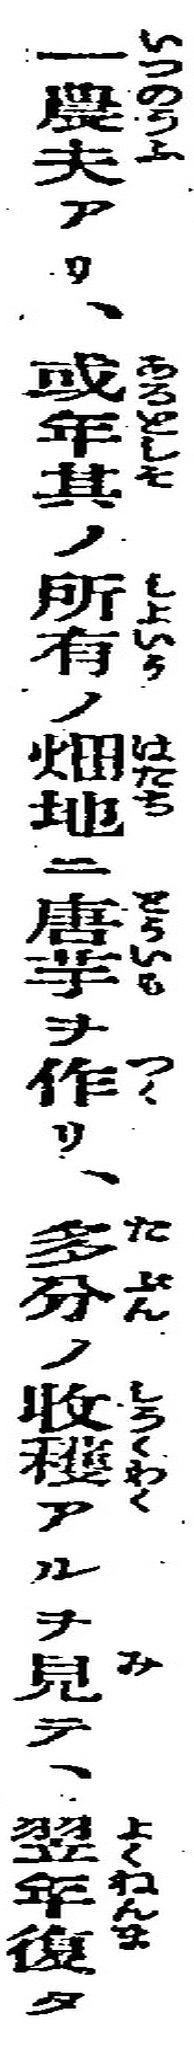一農夫アリ、或年其の所有ノノ畑地ニ唐芋ヲ作リ、多分ノ収穫アルヲ見テ、翌年復タ
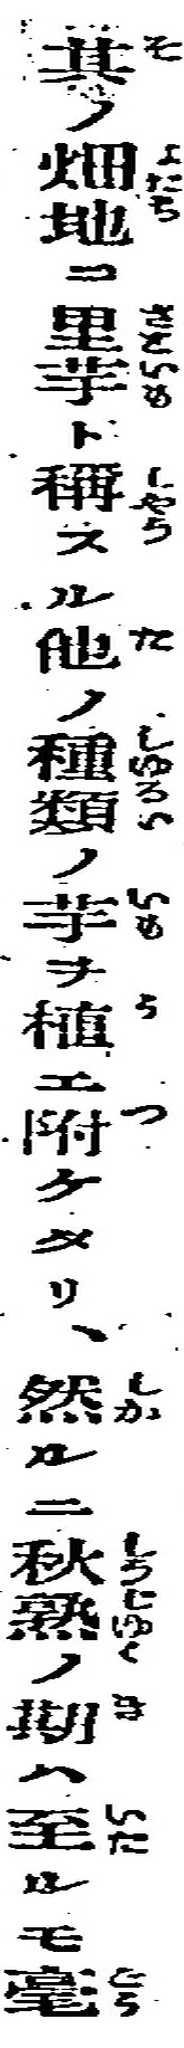其ノ畑地ニ里芋ト称スル他ノ種類の芋ヲ植エ附ケタリ、然ルニ秋熟ノ期ハ至ルモ毫
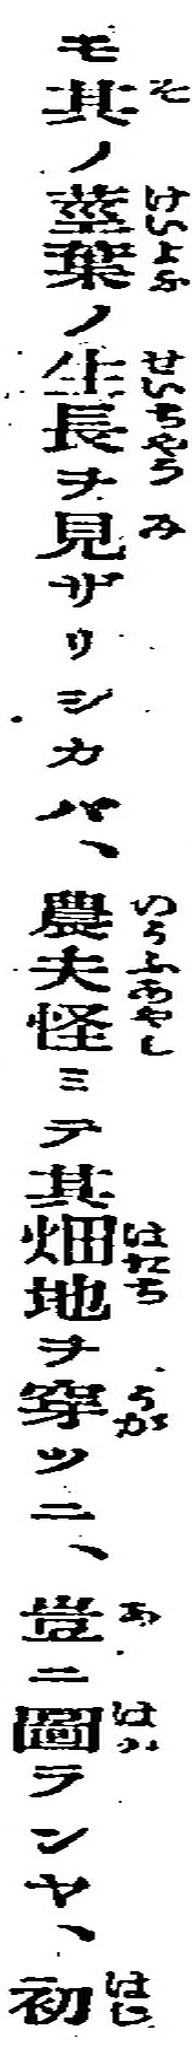モ其ノ茎葉ノ生長ヲ見ザリシカバ、農夫怪ミテ其畑地ヲ穿ツニ、豈ニ図ランヤ、初
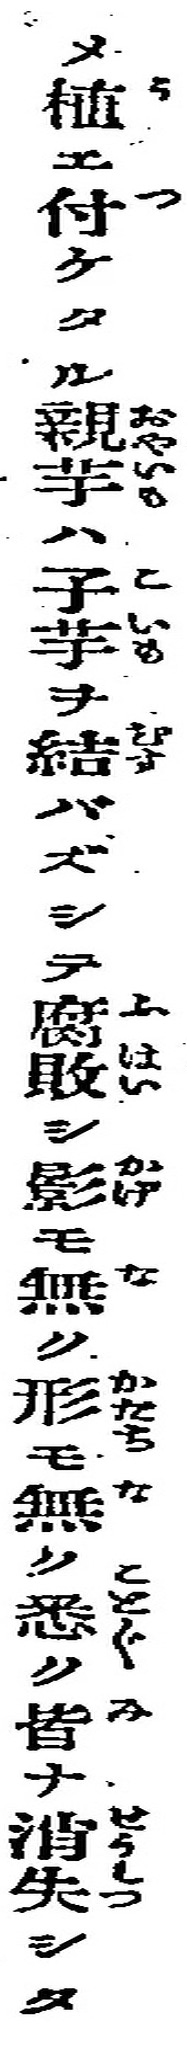メ植エ付ケタル親芋は子芋ヲ結バズシテ腐敗シ影モ無ク形モ無ク悉ク皆ナ消失シタ
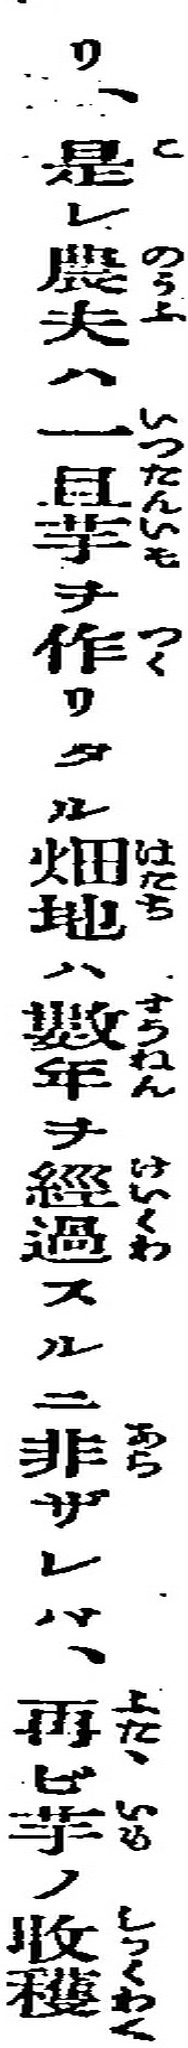リ、是レ農夫ハ一旦芋ヲ作リタル畑地ハ数年ヲ経過スルニ非ザレバ、再ビ芋ノ収穫
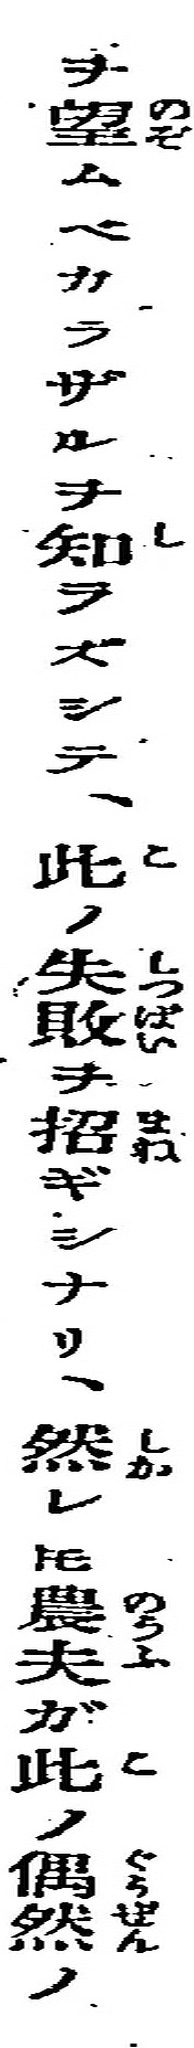ヲ望ムベカラザルヲ知ラズシテ、此ノ失敗ヲ招ギシナリ、然レ𪜈農夫ガ此ノ偶然ノ
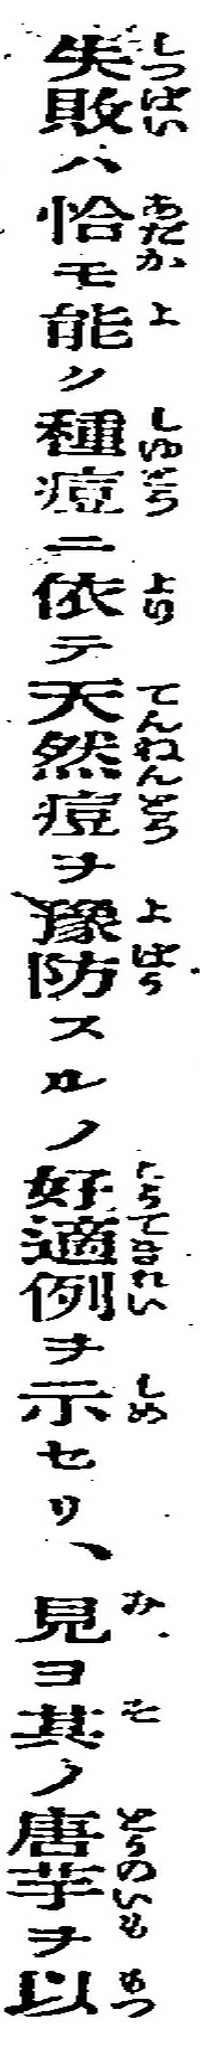失敗ハ恰モ能ク種痘ニ依テ天然痘ヲ予防スルノ好適例ヲ示セリ、見ヨ其ノ唐芋ヲ以
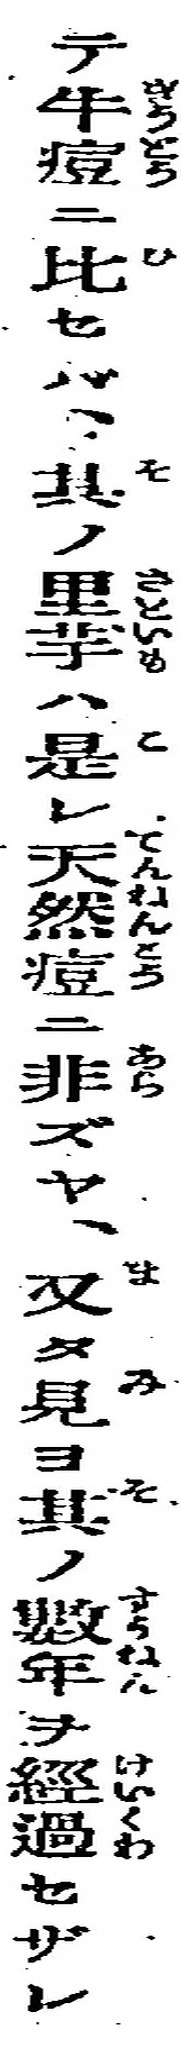テ牛痘ニ比セバ、其ノ里芋ハ是レ天然痘ニ非ズヤ、又タ見ヨ其ノ数年ヲ経過セザレ
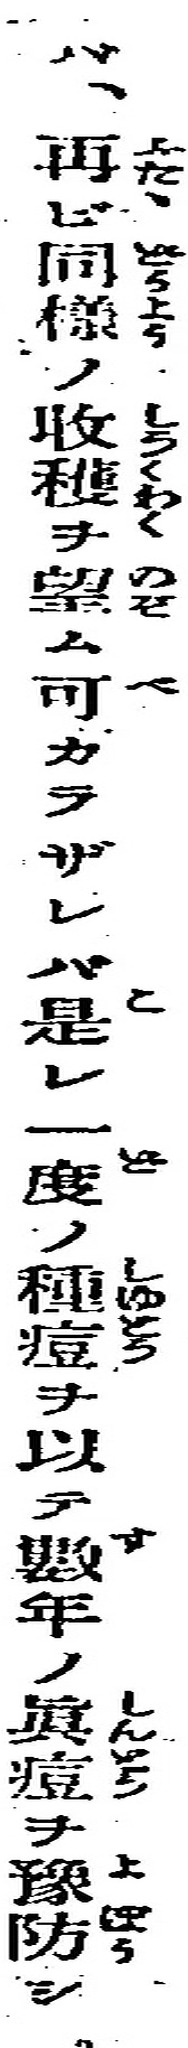バ、再ビ同様ノ収穫ヲ望ム可カラザレバ是レ一度ノ種痘ヲ以テ数年ノ真痘ヲ予防シ
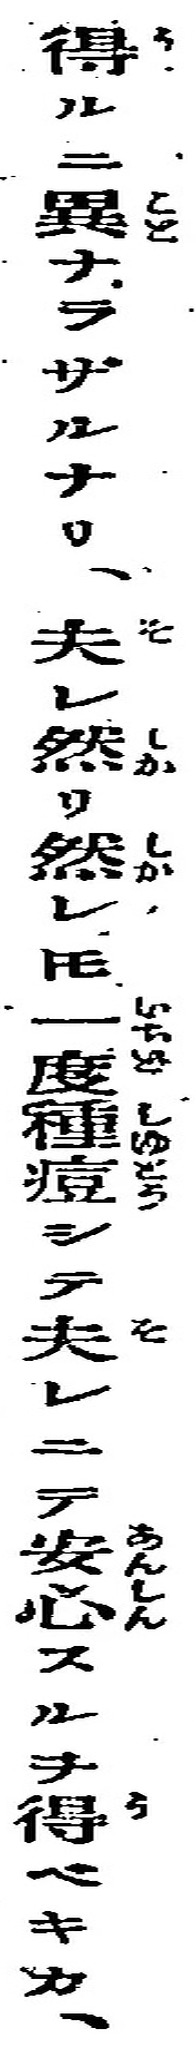得ルニ異ナラザルナリ、夫レ然リ然レ𪜈一度種痘シテ夫レニテ安心スルヲ得ベキカ、
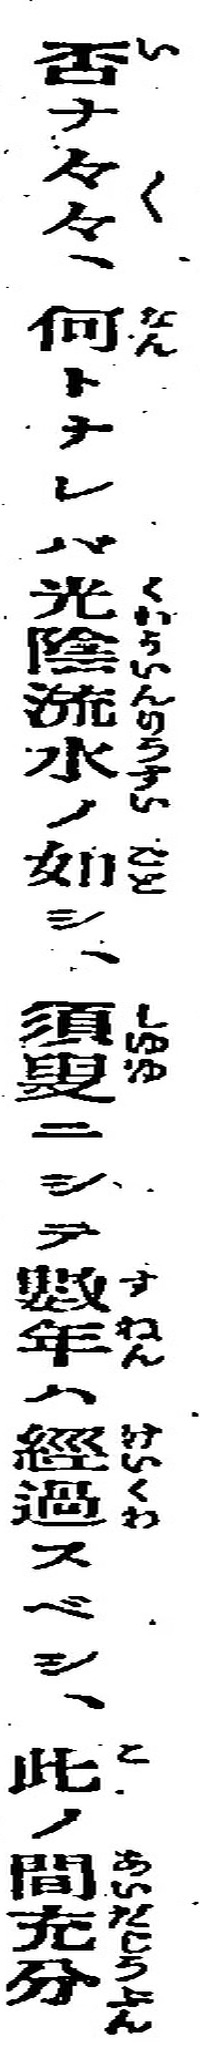否ナ々々、何トナレバ光陰流水ノ如シ、須叟ニシテ数年ハ経過スベシ、此ノ間充分
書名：天然痘予防注意兼種痘者之注意
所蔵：国立国会図書館 National Diet Library, JAPAN
